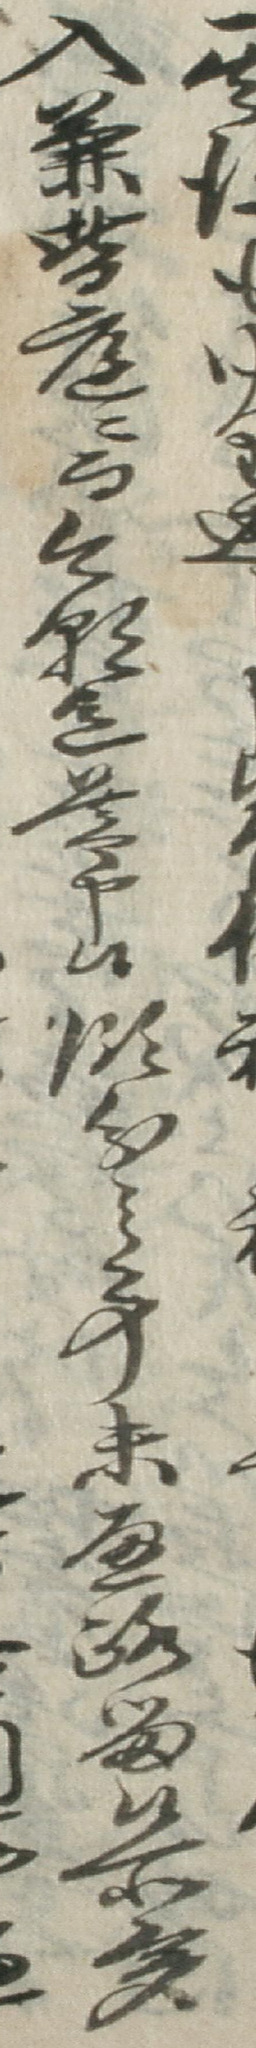入兼暫庭二而今朝迄暮申候領分之事未通路留候所多
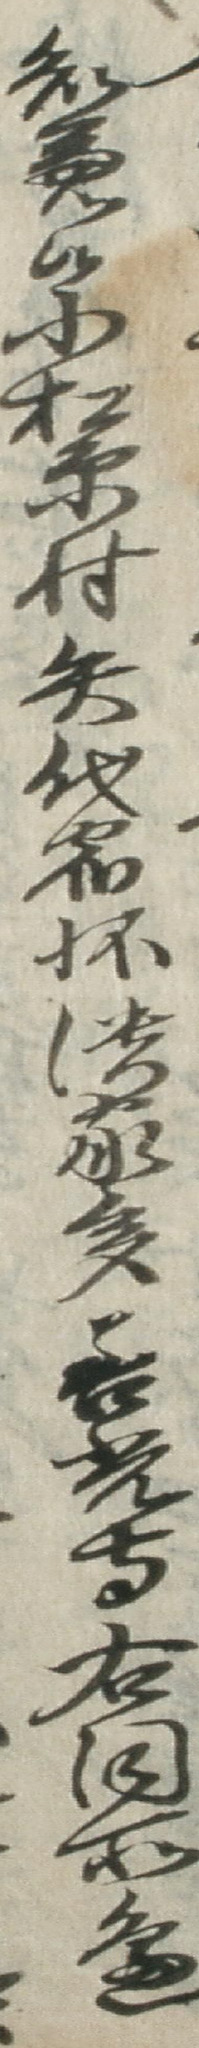知兼候小松原村矢代宿抔潰家多善光寺右同所辺
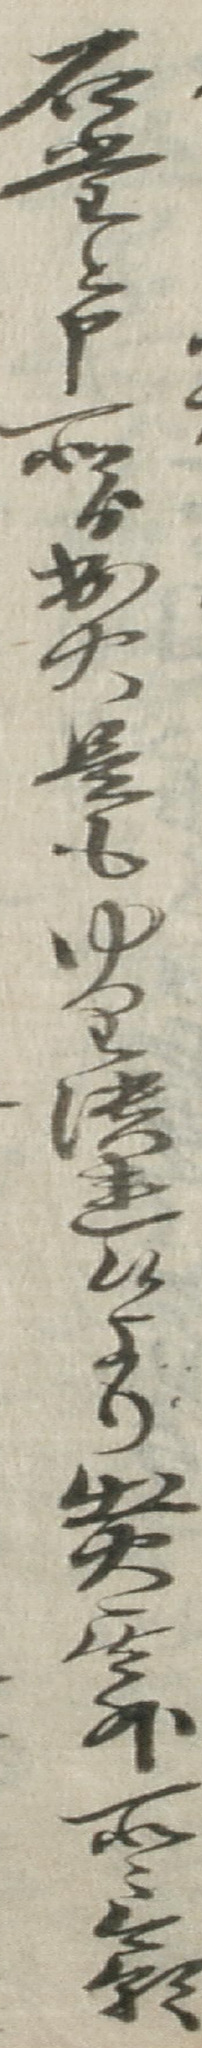石堂と申所ゟ出火是もゆり潰れ候より出火其外所々今朝
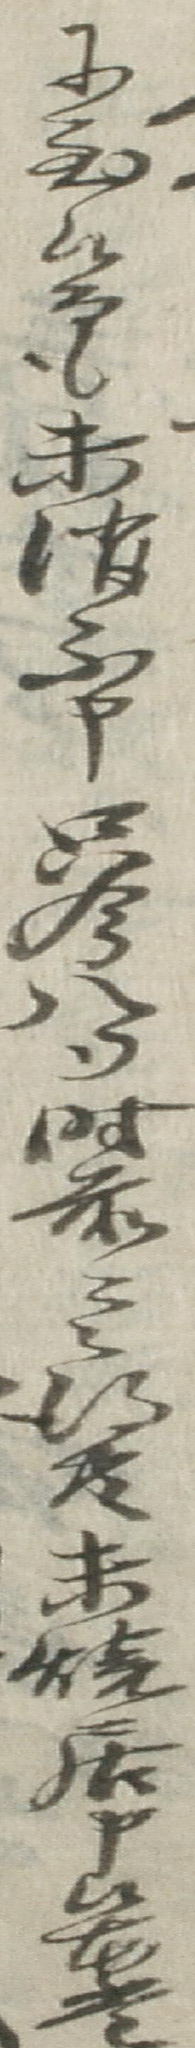に至候而も未消不申只今八ッ時前二候得共未焼居申候本堂
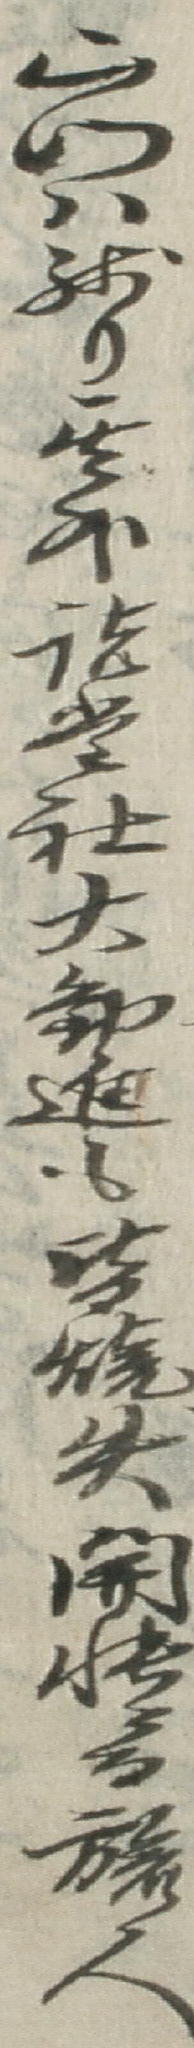山門ハ残り其外諸堂社大勧進も皆焼失開帳二而旅人
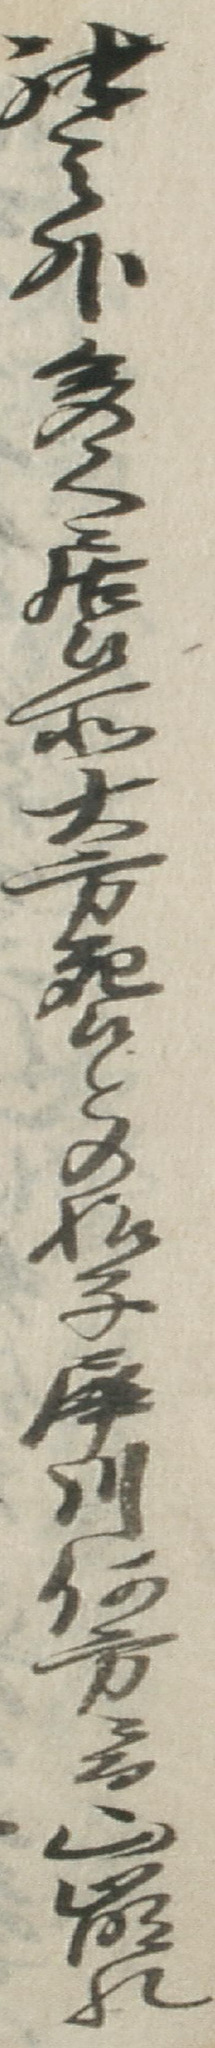殊之外多く居候所大方死候との様子犀川何方二而山崩れ
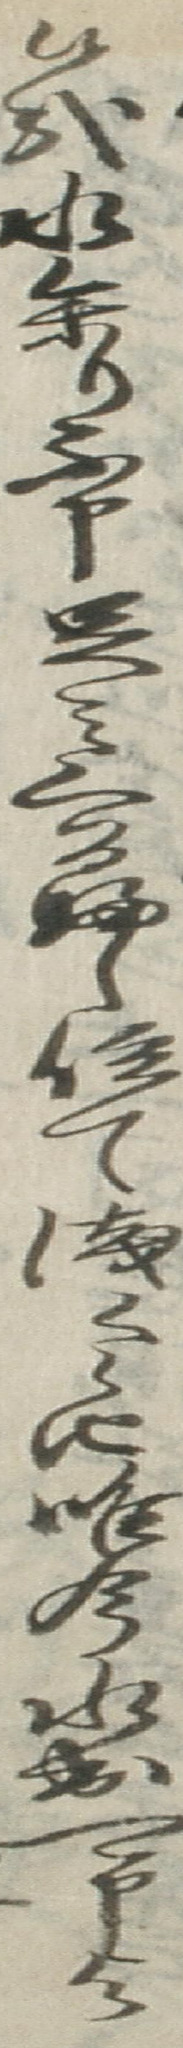候哉水参り不申足之くるふし位て浅く候由唯今水出可申と
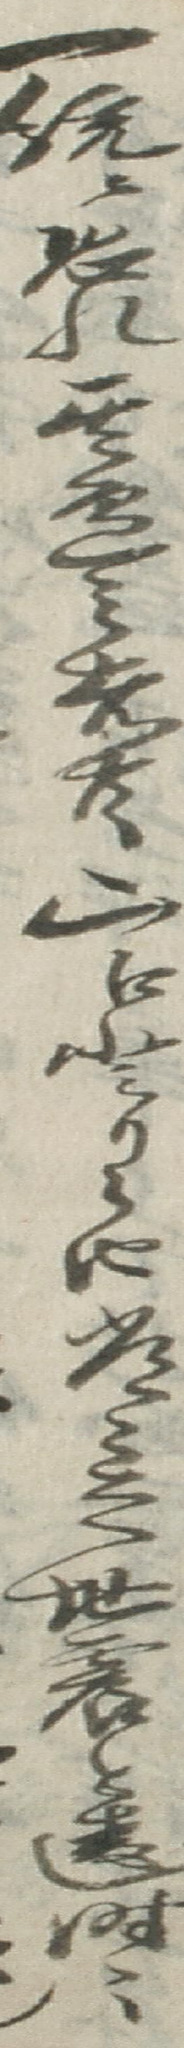一統二恐れ其辺之者共山江登り候由常々之地震と違時々
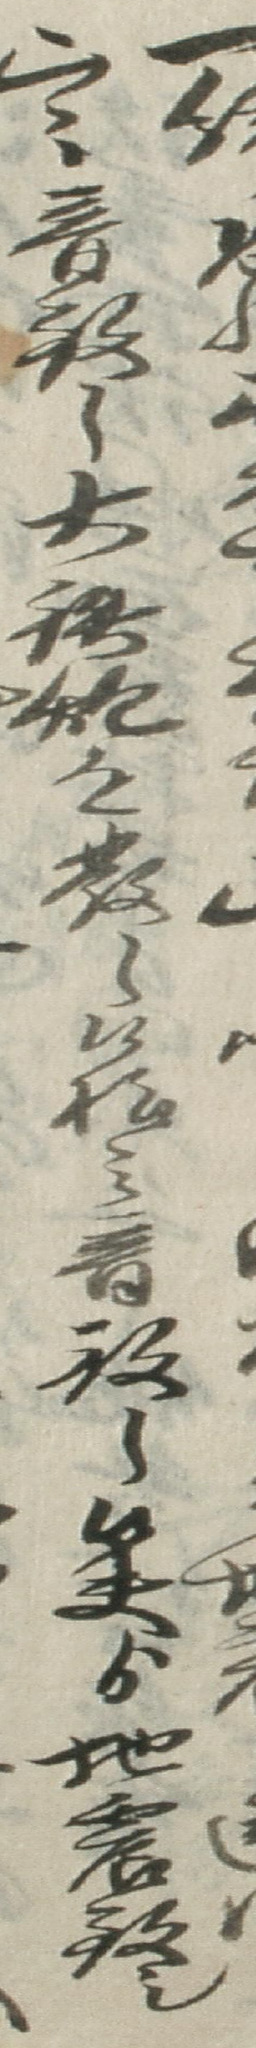山々音致し大鉄炮を發し候様之音放し候夫ゟ地震致ㇱ
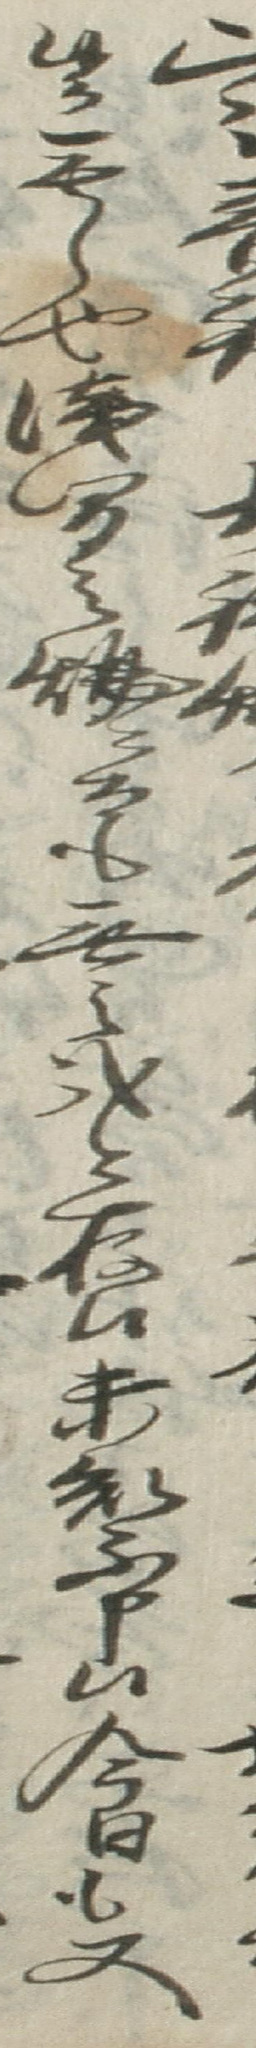候而其也浅間之焼二而も無之候哉と存候未知不申候今日も又
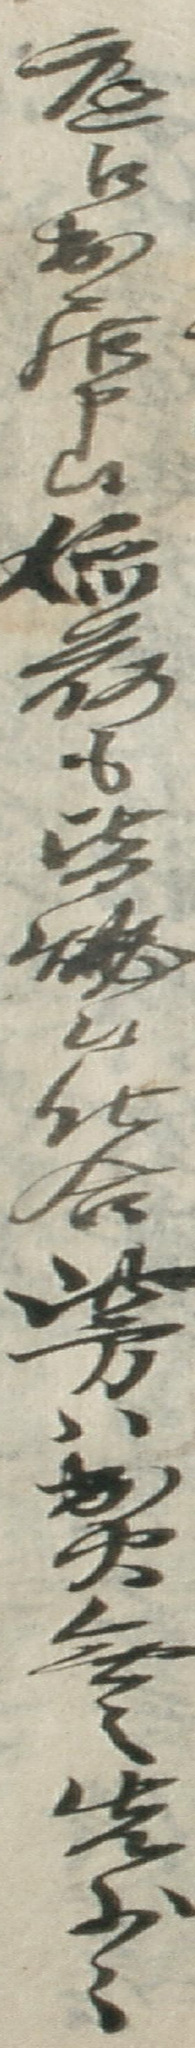庭江出居申候稲荷も皆焼候仕合此方ハ出火無之先少々
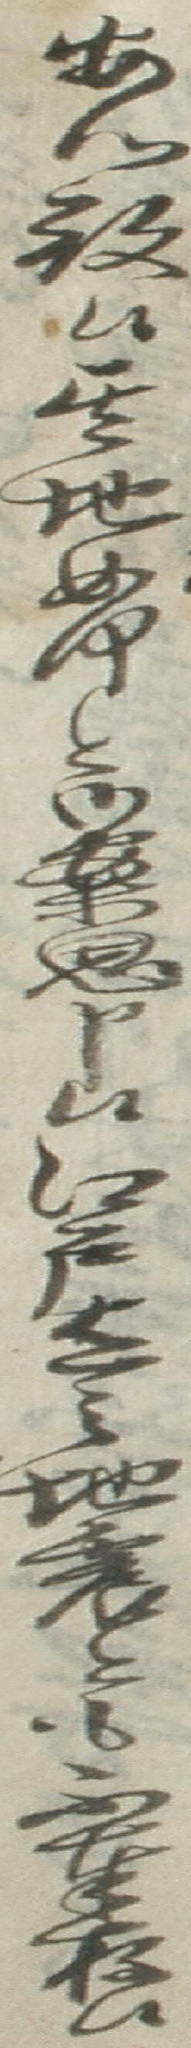安心致候其地如何と御案思申候江戸迄之地震とも不奉存候
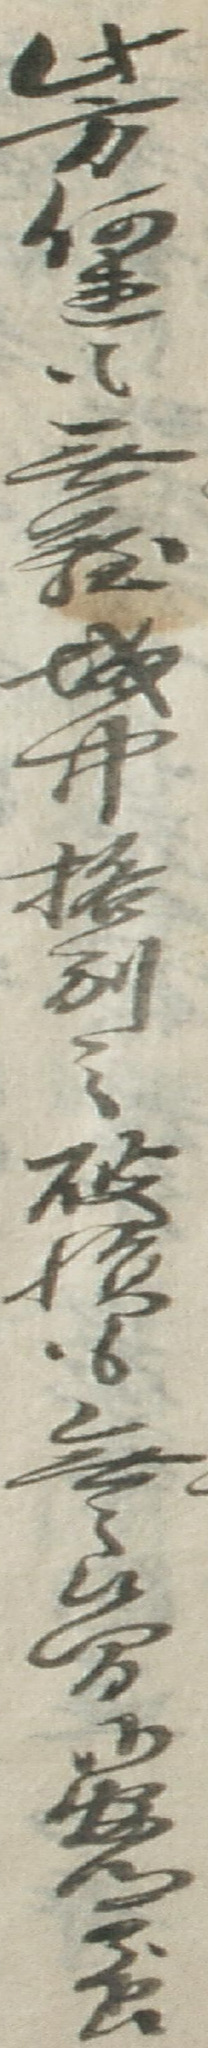此方何れも無難城中格別之破損も無之候間御安心被下候
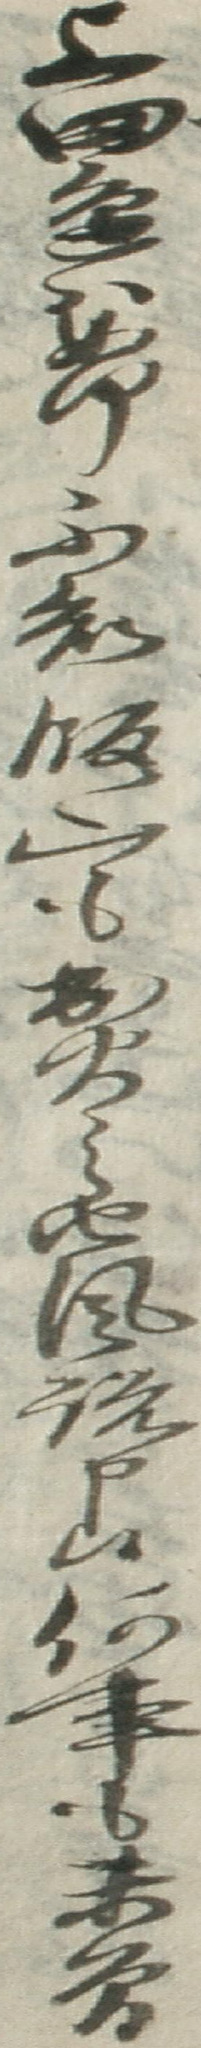上田辺ハ如何不知飯山も出火之由風説申候何事も未曾
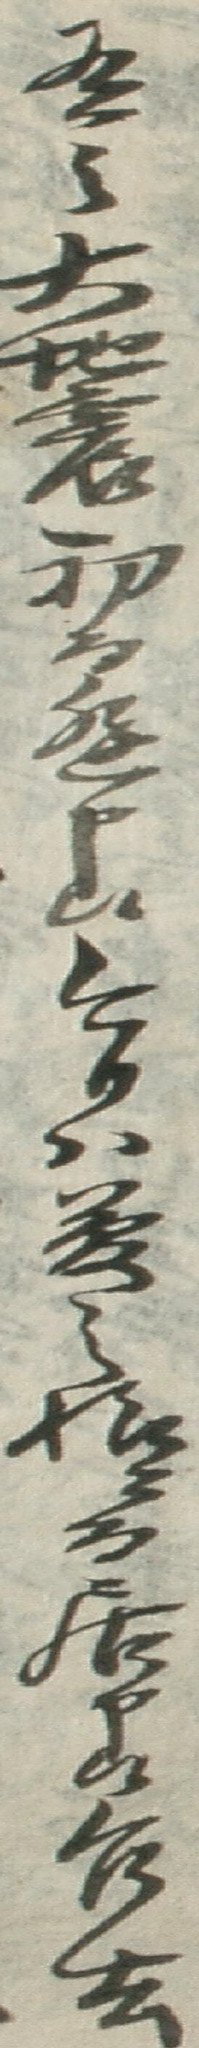有之大地震初而逢申候今日ハ夏之様二而居申候乍去
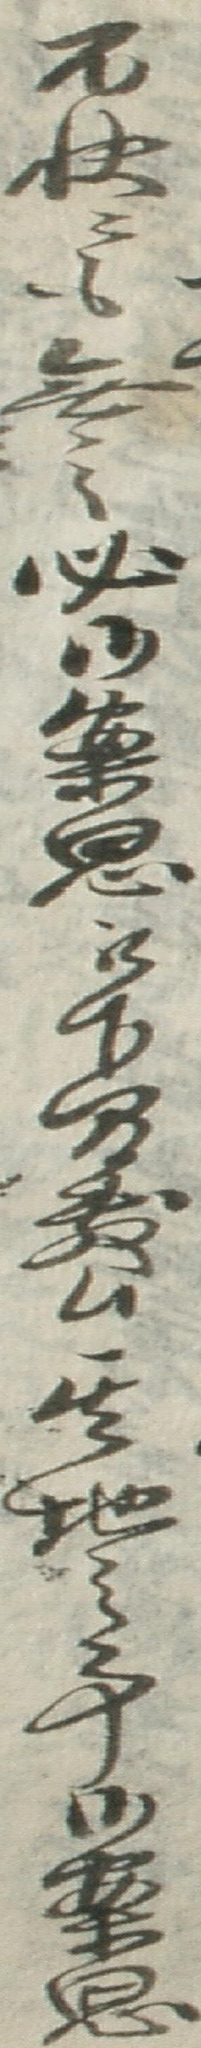不快二も無之必御案思被下間敷候其地之事御案思
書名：信濃國地震實録記
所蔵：東京大学地震研究所図書室 Earthquake Research Institute Library, The University of Tokyo, JAPAN
